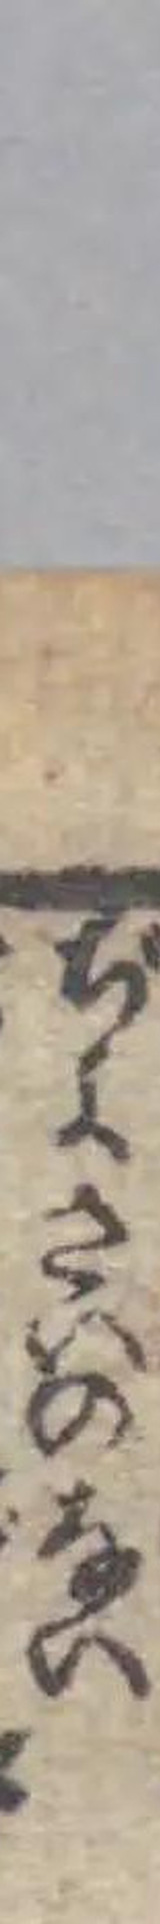ぢよさいのない
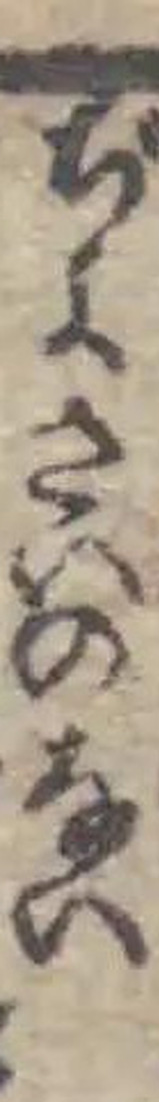ぢよさいのない
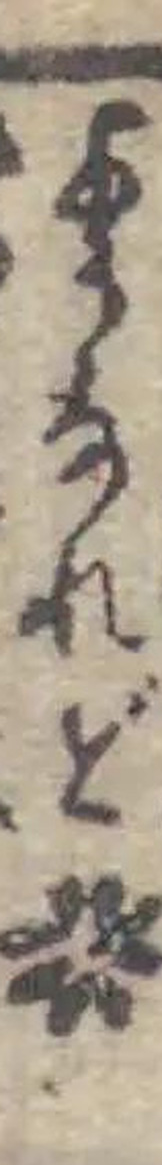ようなれど
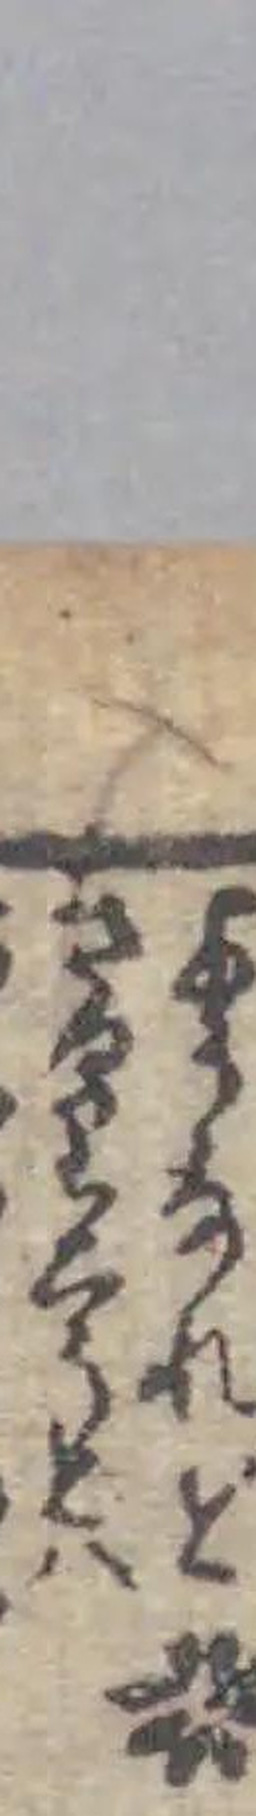さるりこうとは
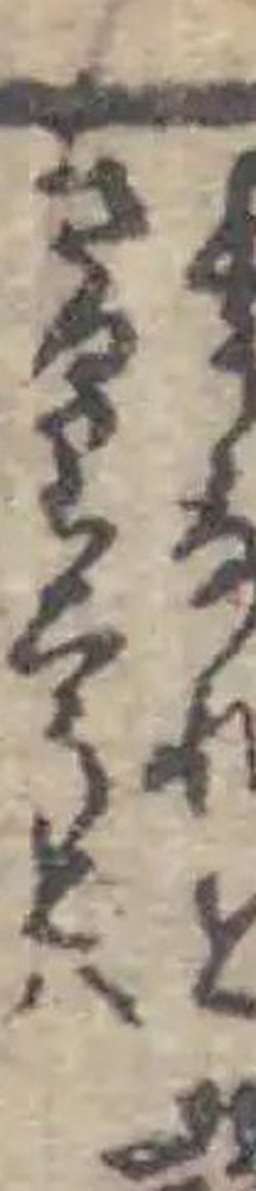さるりこうとは
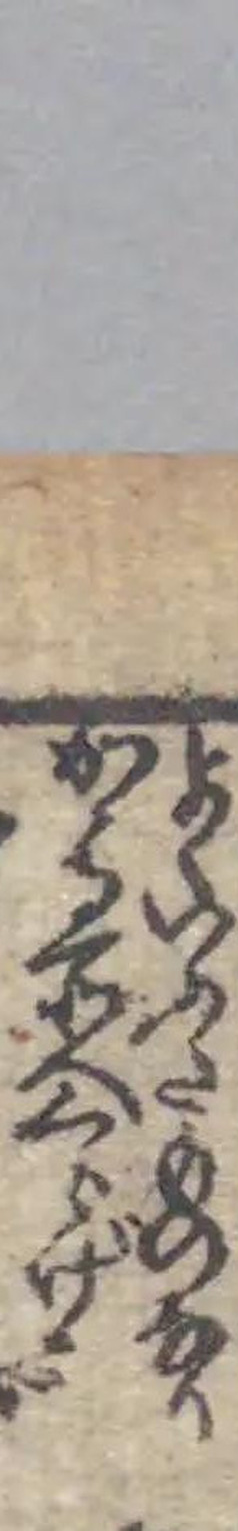かゝる所へくらげ
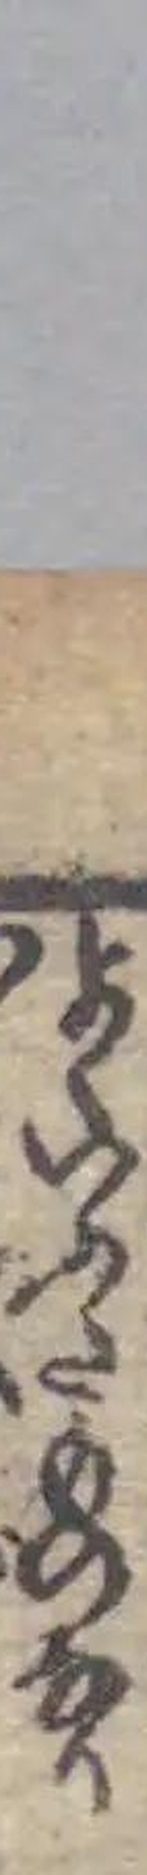よくいふたものなり
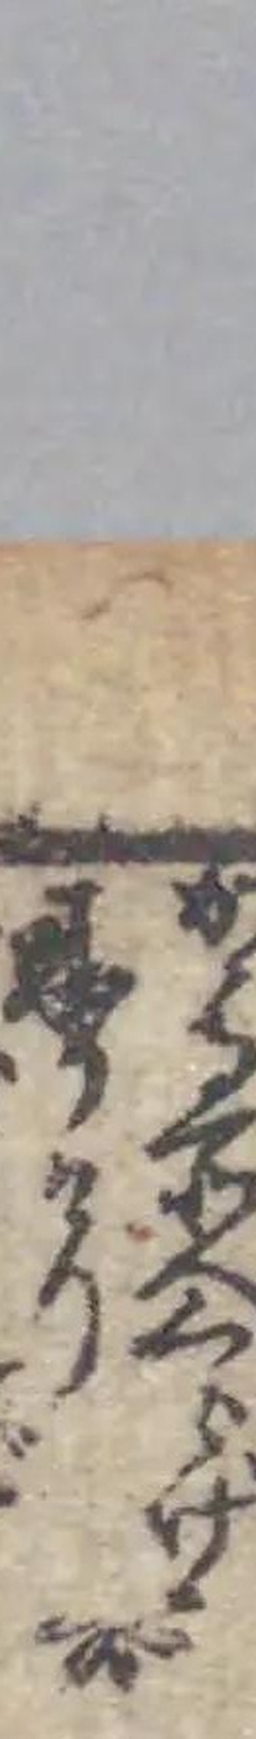来りけり
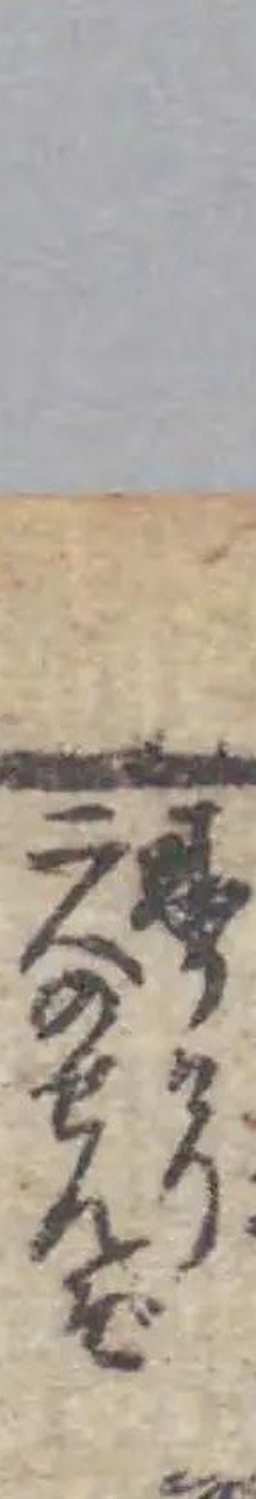二人のせんぞ
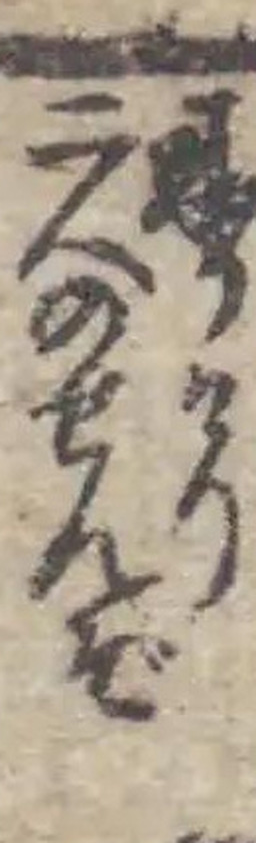二人のせんぞ
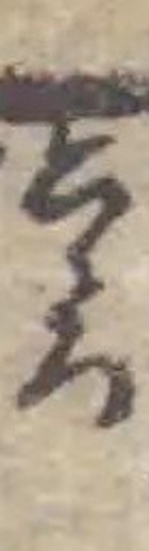こゝろ
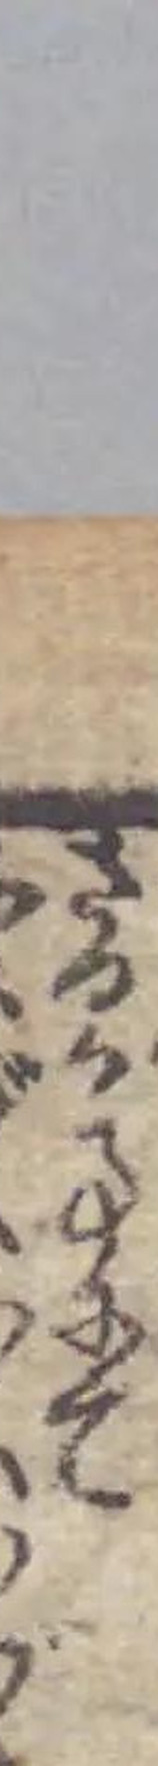さるが事にて
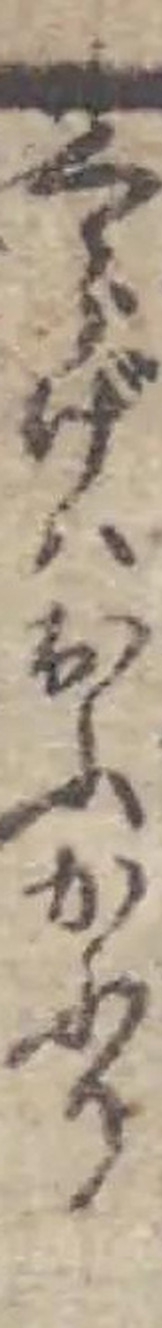くらげはおふかぶり
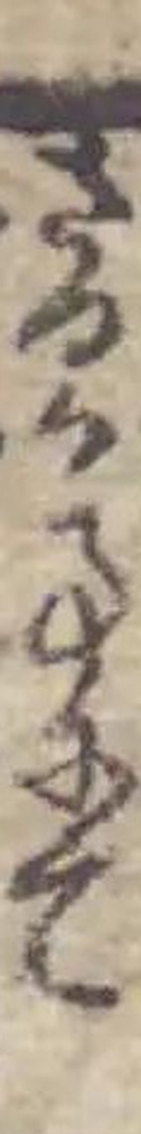さるが事にて
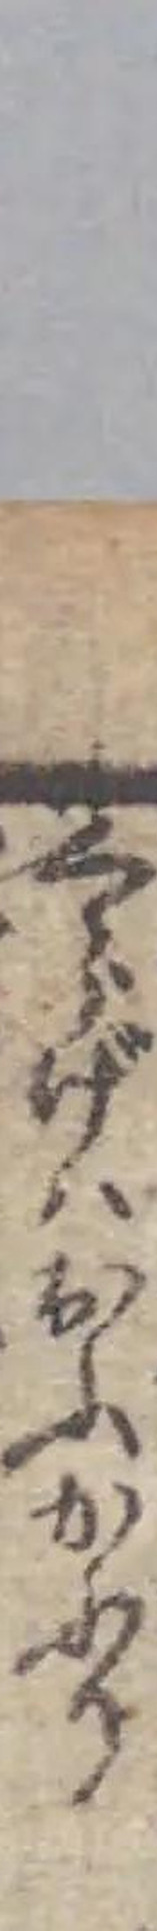くらげはおふかぶり
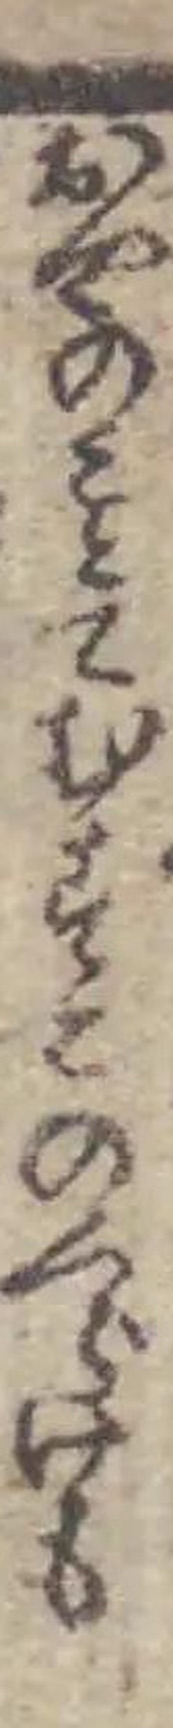おやのことてむすこのくらけも
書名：蟹牛房挟多 3巻
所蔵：国立国会図書館 National Diet Library, JAPAN
